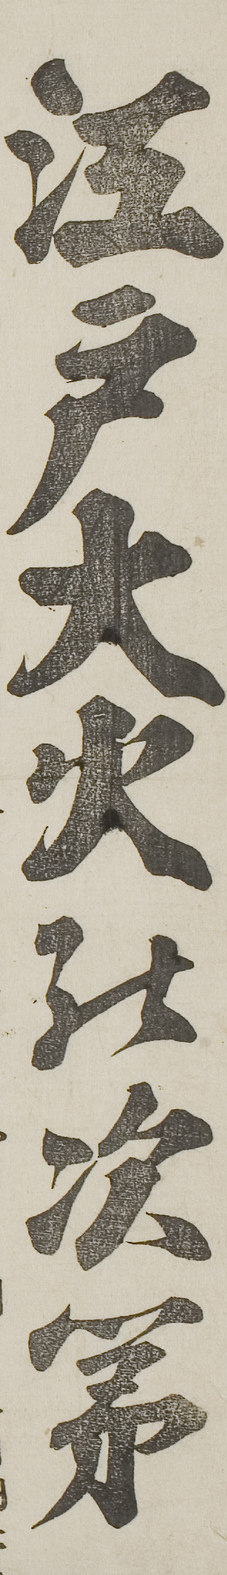江戸大火の次第
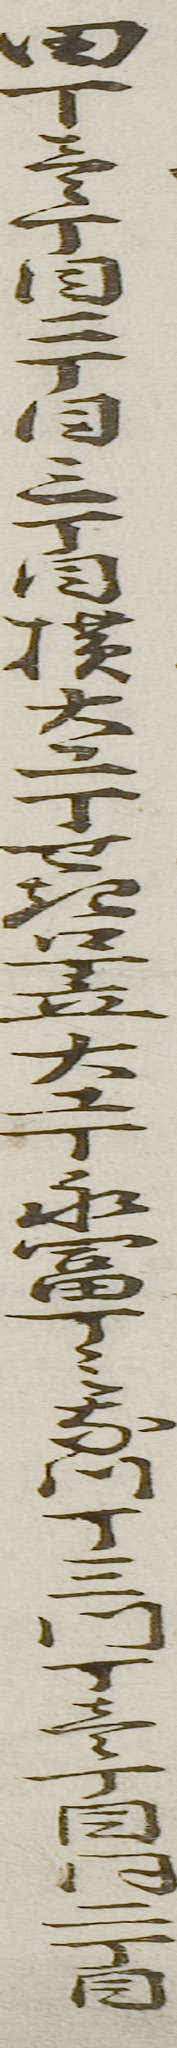田丁壱丁目二丁目三丁目横大工丁せき口丁立大工丁永冨丁みな川丁三川丁壱丁目同二丁目
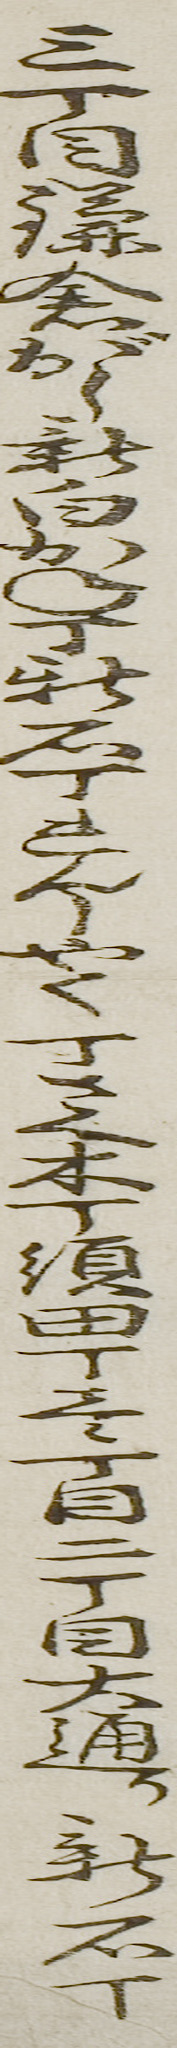三丁目鎌倉がし新白かね丁新石丁れんしゃく丁さへ木丁須田丁壱丁目二丁目大通り新石丁
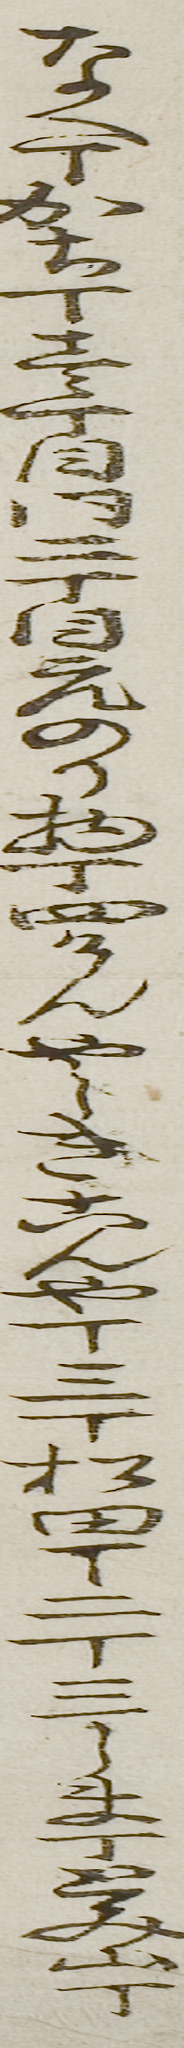なへ丁かち丁壱丁目同二丁目元のり物丁四けんやしきこんや丁三丁松田丁二丁三しま丁とみ山丁
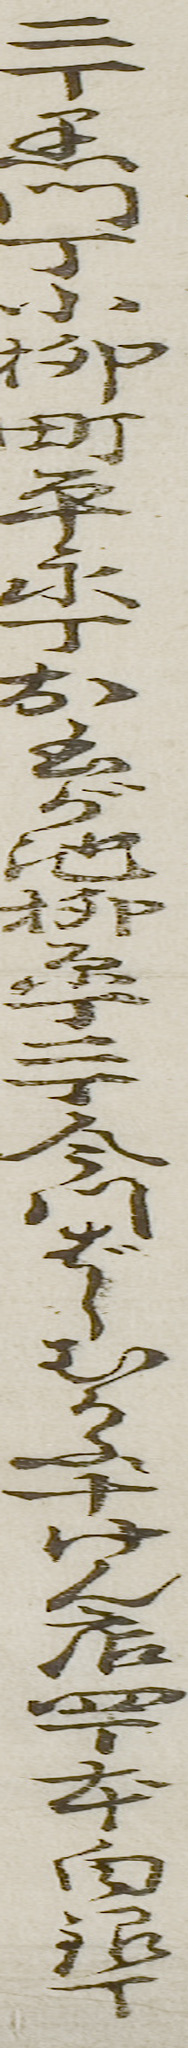二丁黒門町小栁丁平永丁お玉が池栁原丁二丁今川ばしむかふ十けん店四丁本白銀丁
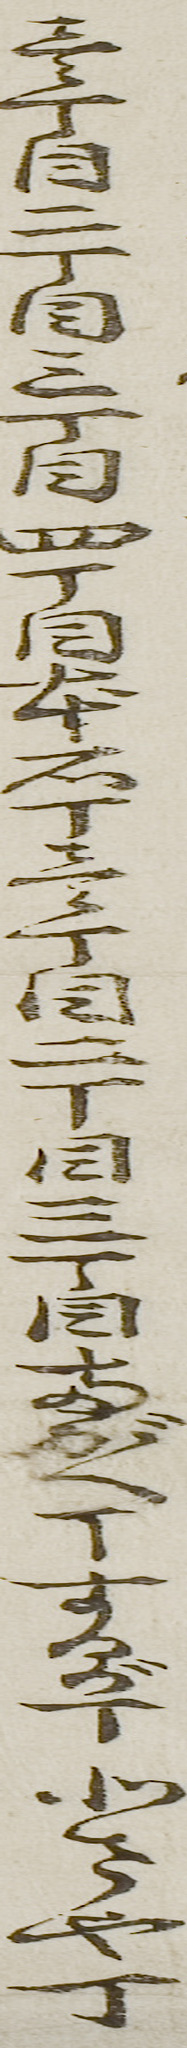壱丁目二丁目三丁目四丁目本石丁壱丁目二丁目三丁目両がへ丁するが丁北さや丁
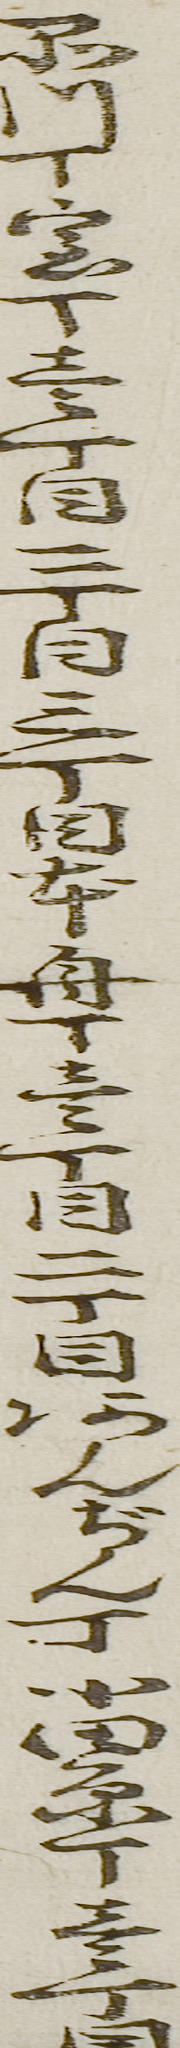品川丁室丁壱丁目二丁目三丁目本舟丁壱丁目二丁目あんぢん丁小田原丁壱丁目
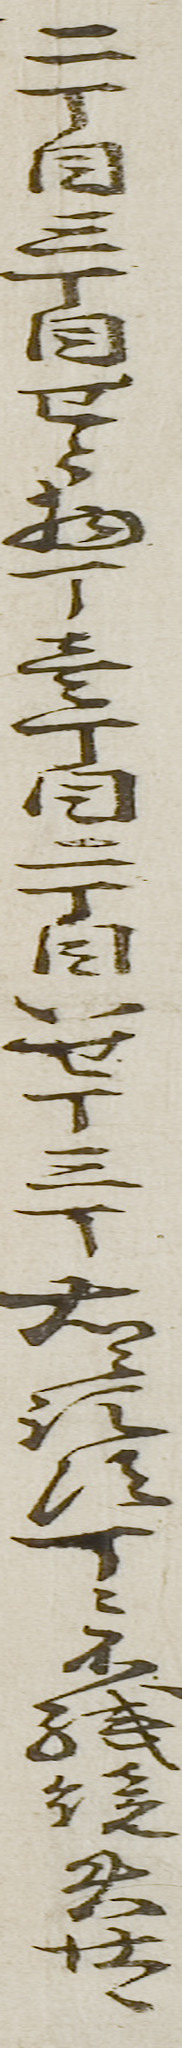二丁目三丁目せと物丁壱丁目二丁目いせ丁三丁右二江津丁二不残焼失仕候
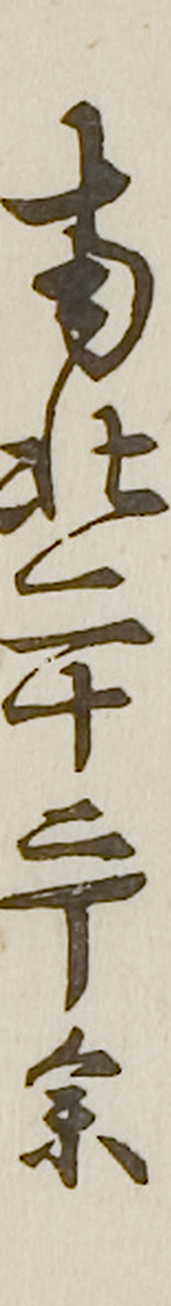南北二十二丁余
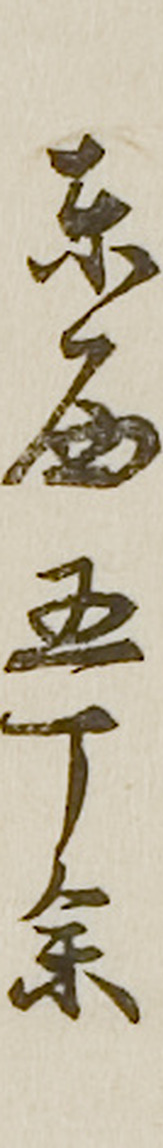東西五丁余
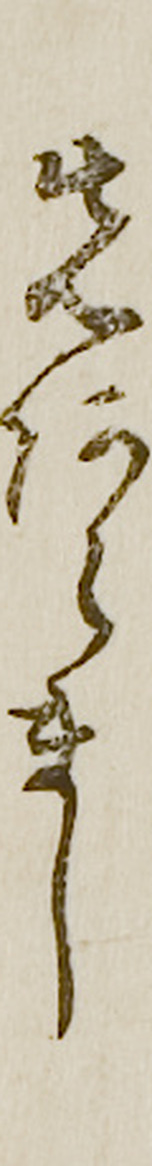失あらまし
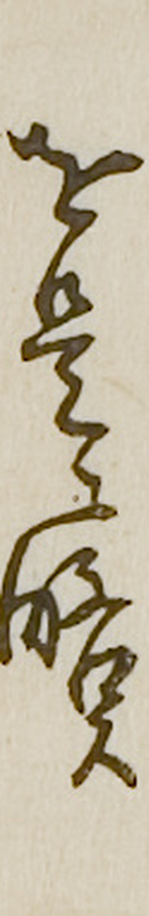を是二略ス
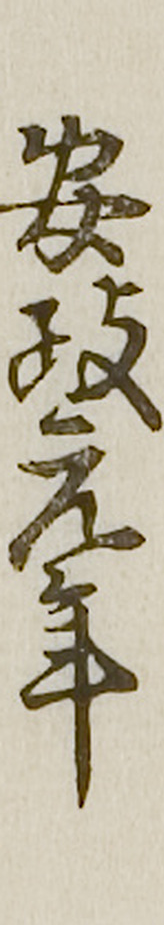安政元年
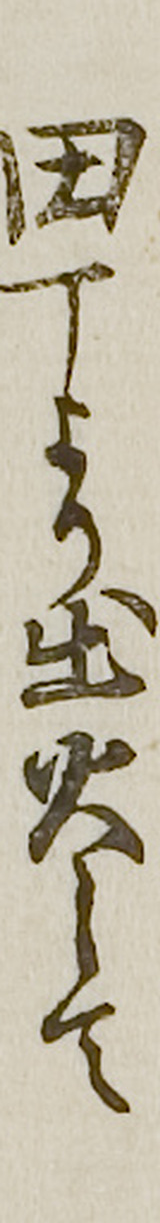田丁より出火して
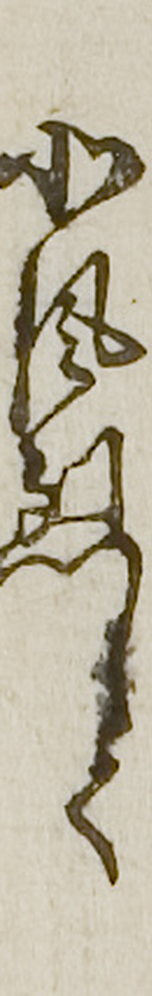北風烈しく
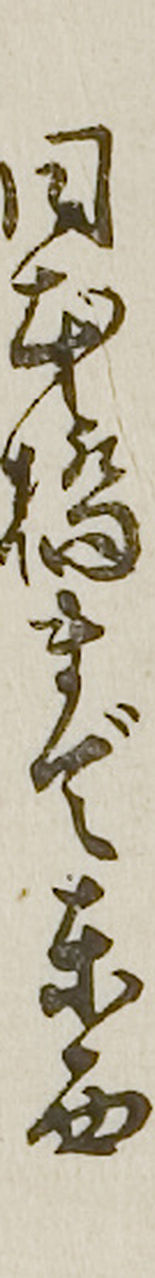日本橋まで東西
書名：江戸大火の次第
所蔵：東京大学総合図書館 General Library in the University of Tokyo, JAPAN
